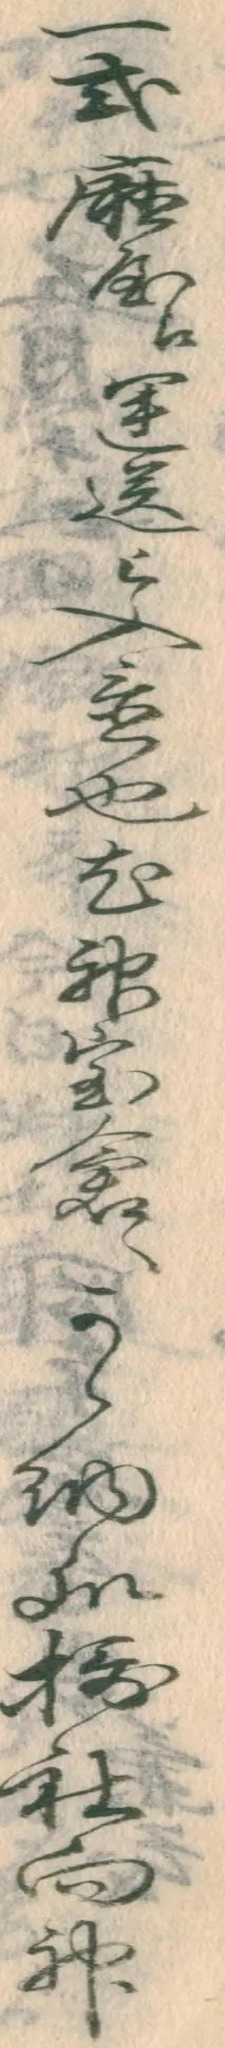一式庁屋江運送被入置也尤神宝倉へ可被納処摂社向神
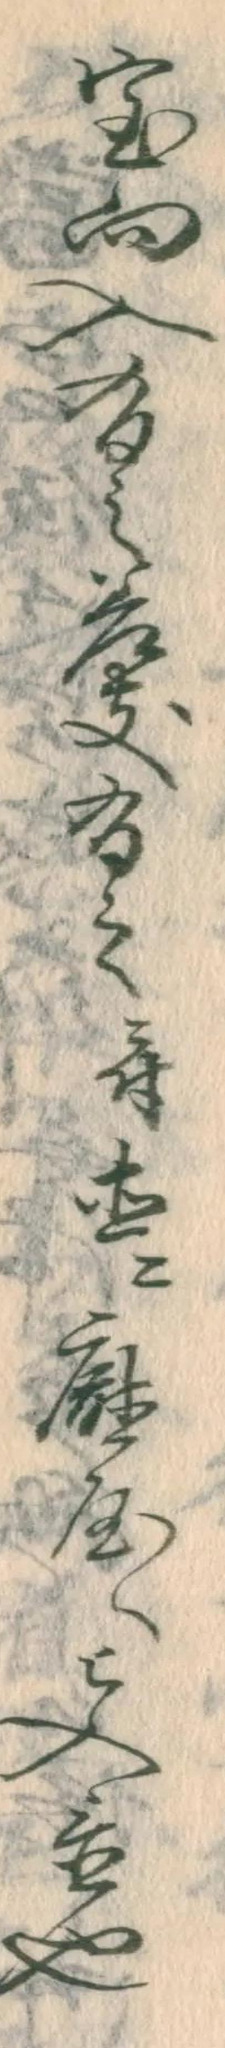宝向入有之差支有之ニ付直ニ庁屋へ被入置也
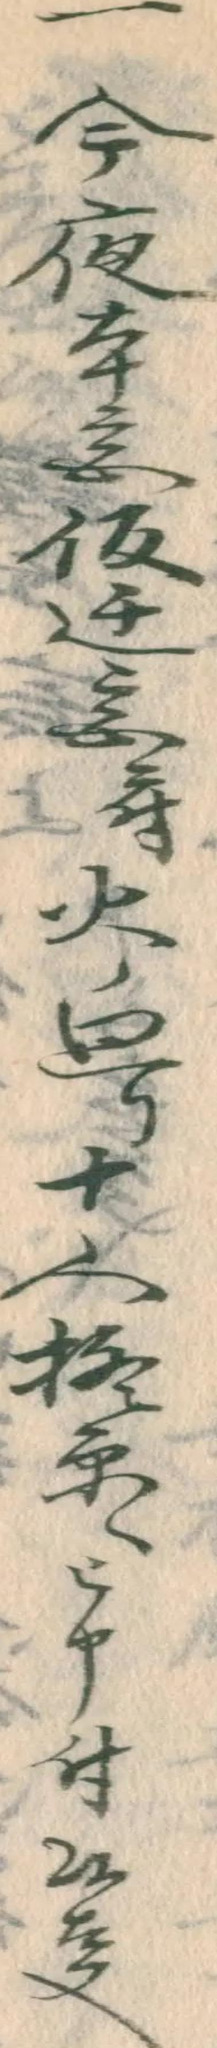一今夜本宮仮迁宮ニ付火ノ廻り十人柊原へ被申付候事
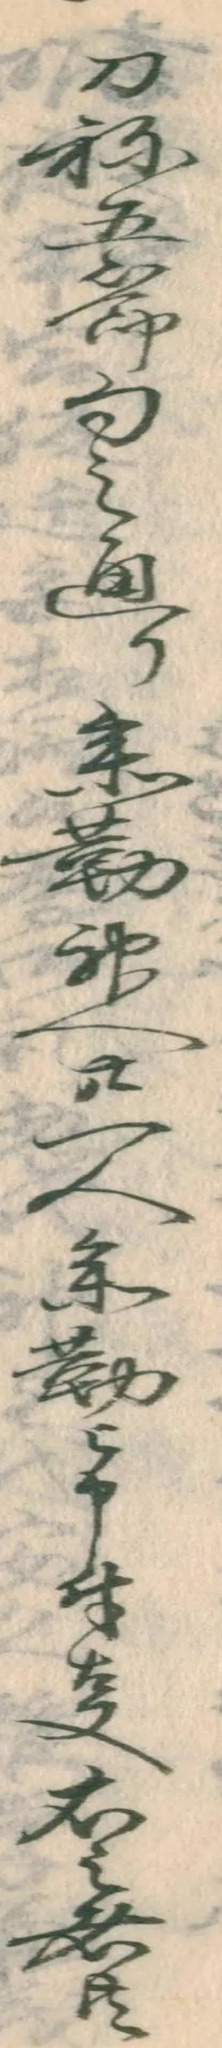一刀祢五節句之通り参勤神人廿一人参勤被申付事右之者共
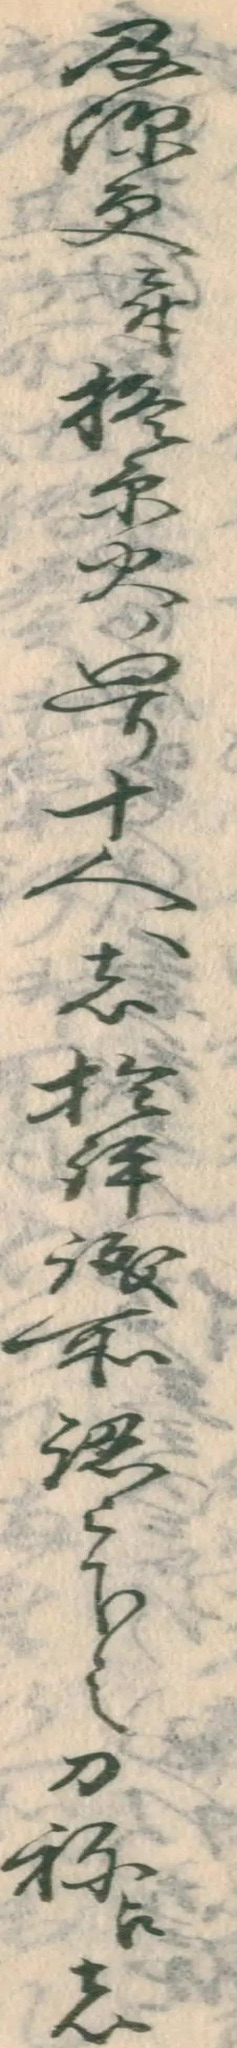及深更ニ付柊原火ノ廻り十人へは於評議所認被下之刀祢江は
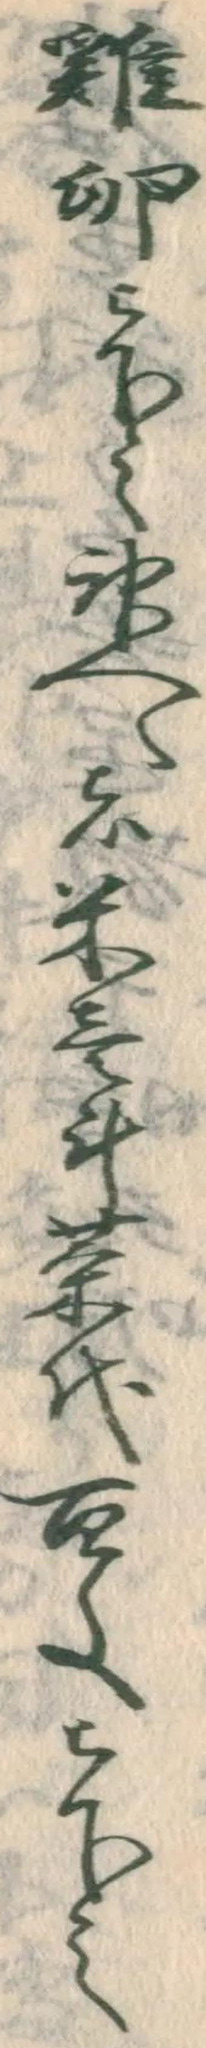鶏卵被下之神人へは米壱斗茶代百文被下之
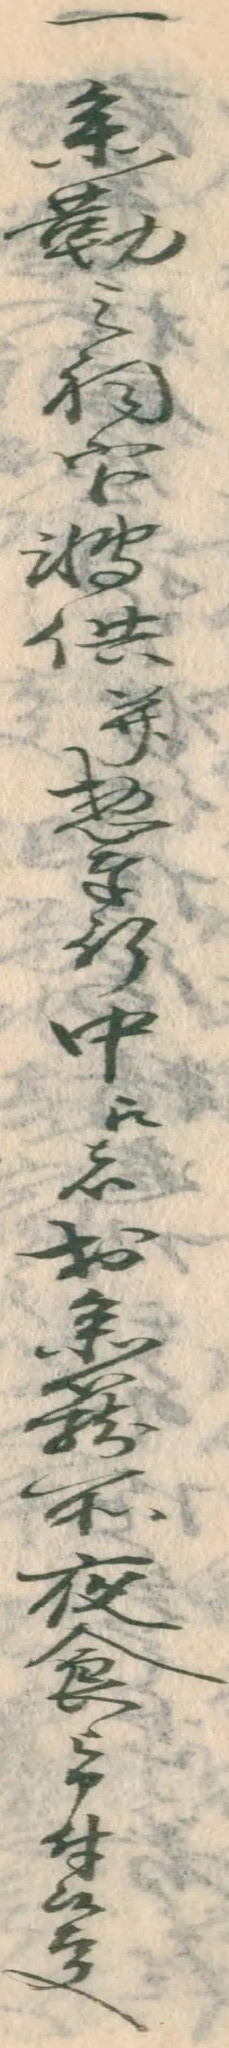一参勤之祠官転供并惣奉行中江は於参籠所夜食被申付候事
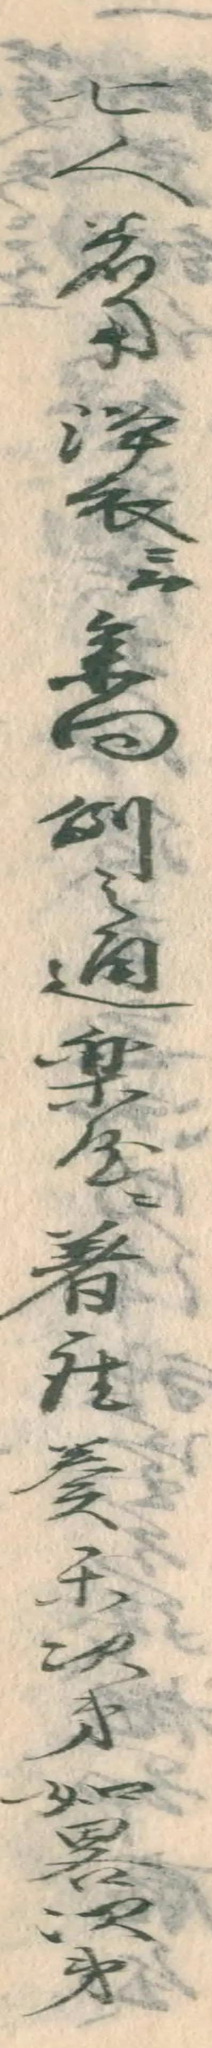七人着用浄衣ニ而参向例之通楽屋ニ着座奏楽次第如略次第
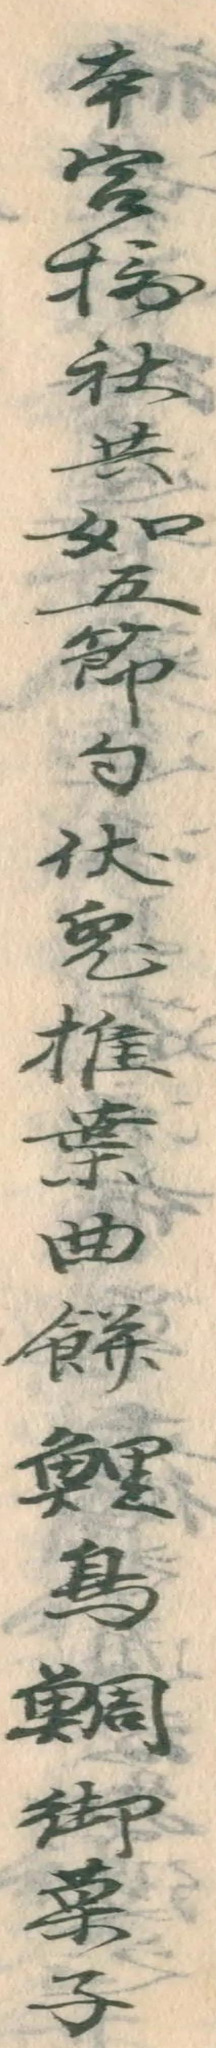一本宮摂社共如五節句伏兎椎葉曲餅鯉鳥鯛御菓子
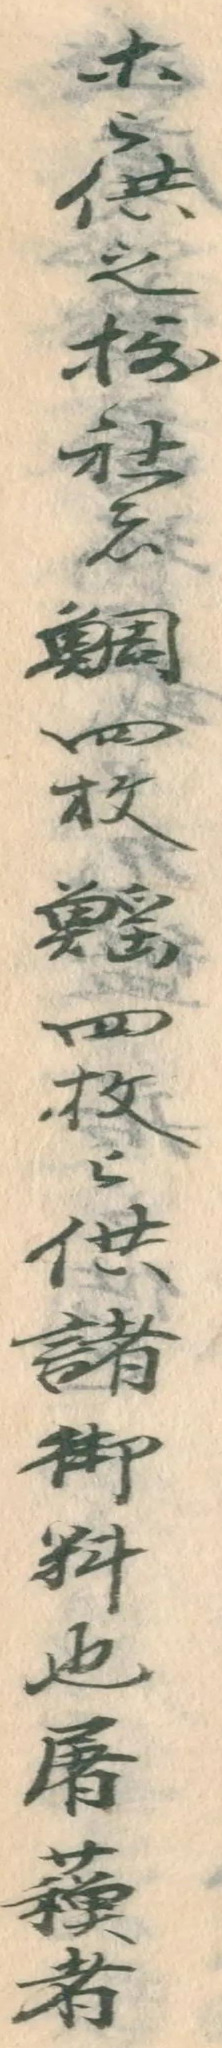等被供之摂社は鯛四枚鰩四枚被供諸御料也屠蘓は

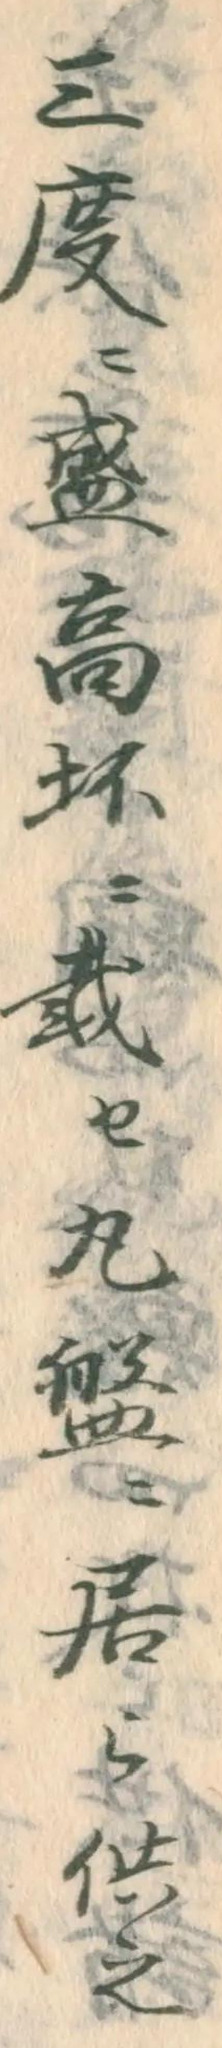三度ニ盛高杯ニ載セ丸盤ニ居被供之
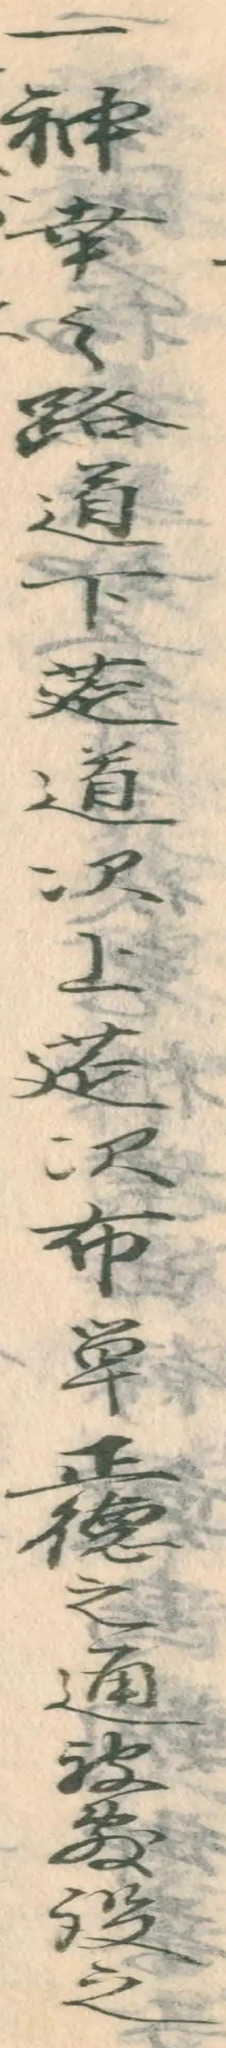一神幸之路道下筵道次上莚次布単正徳之通被敷設之
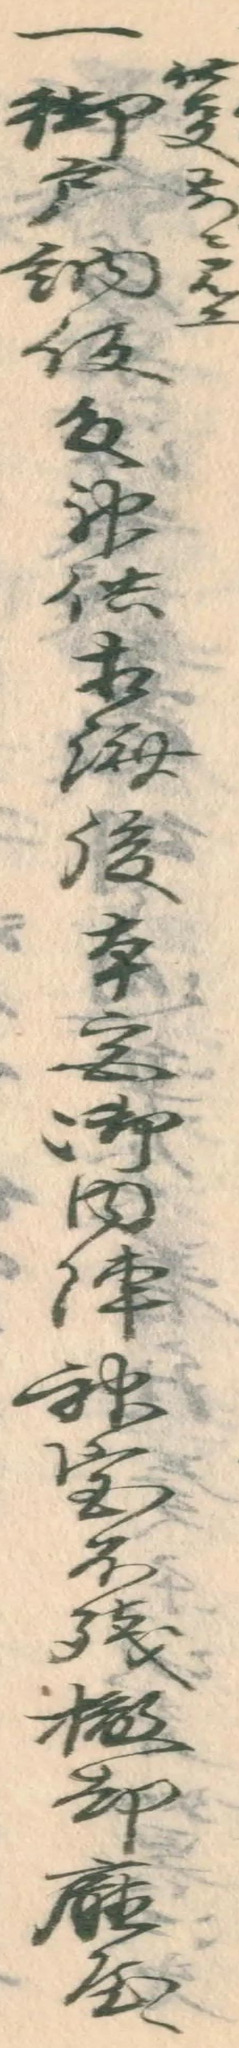一御戸納仮殿神供相済後本宮御内陣神宝不残撤却庁屋へ
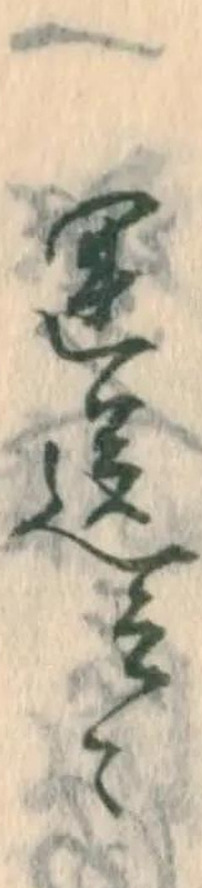運送云々
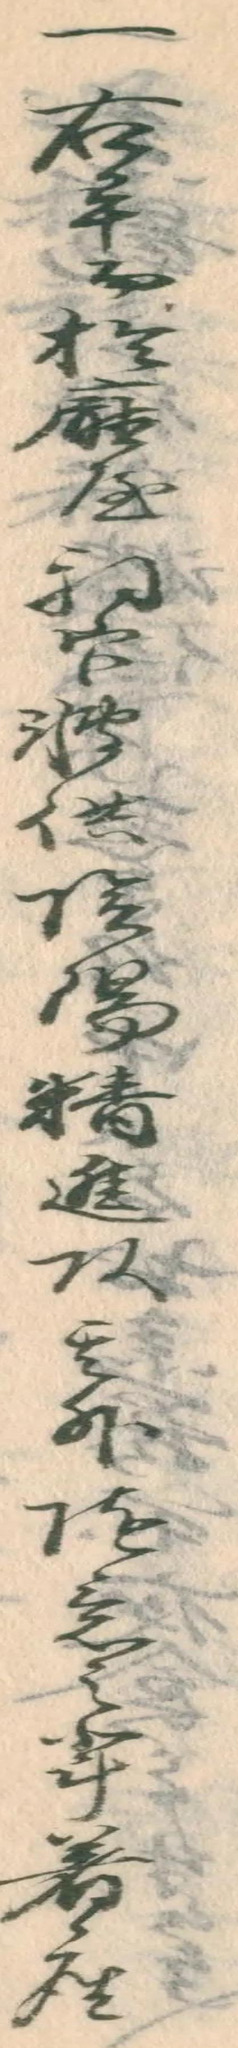一右畢而於庁屋祠官転供陰陽精進頭其外随意之輩着座
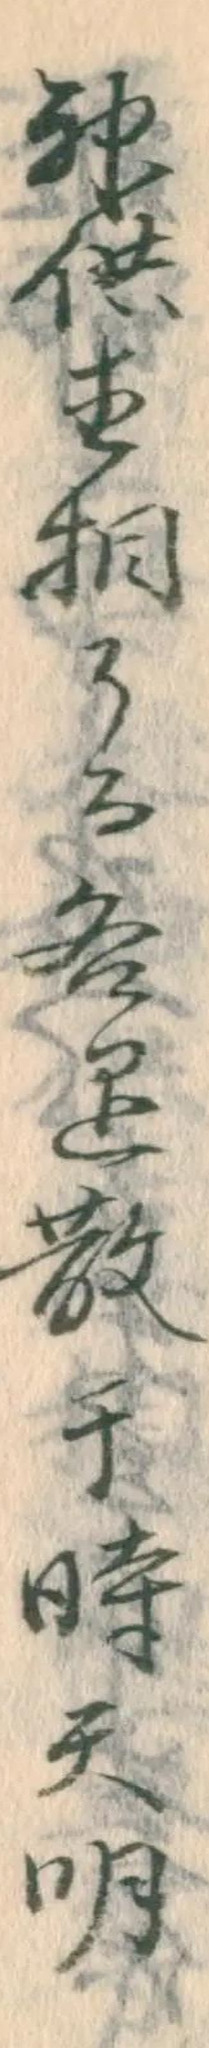神供直相了而各退散于時天明
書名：賀茂社記録. 第17冊
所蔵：国立国会図書館 National Diet Library, JAPAN
